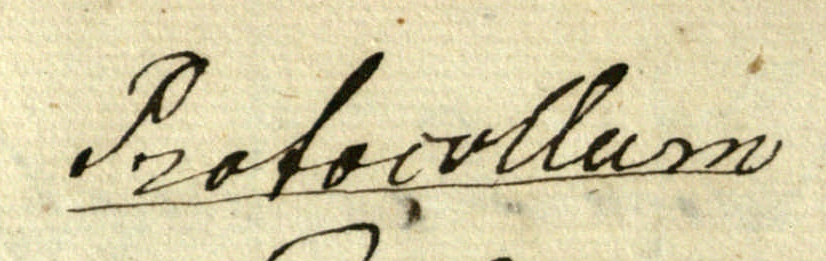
Protocollum
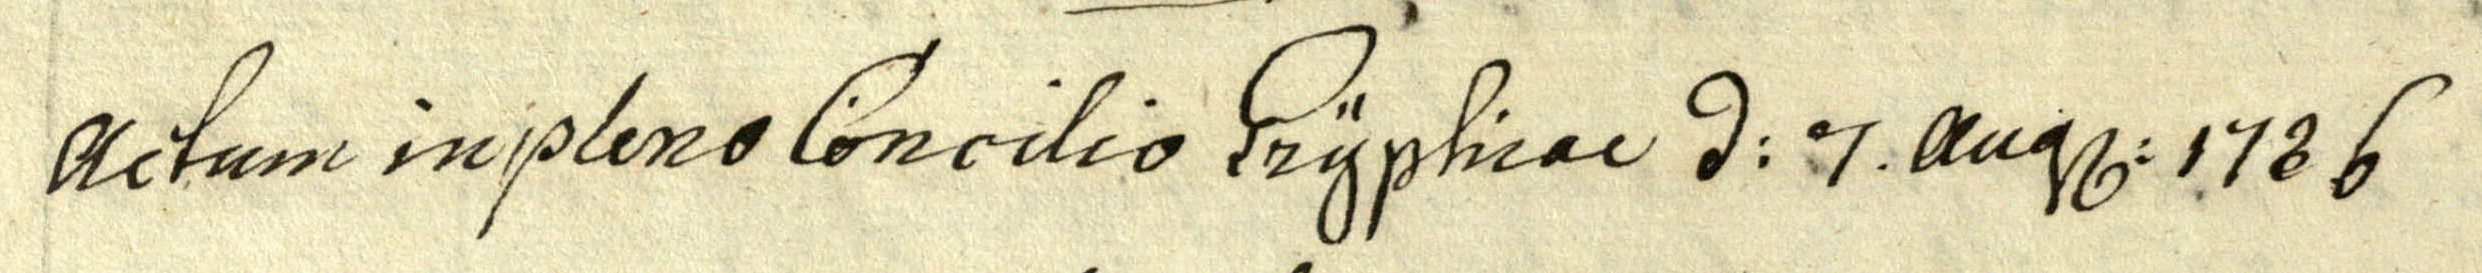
Actum in pleno Concilio Grÿphiae d. 7. Aug. 1786
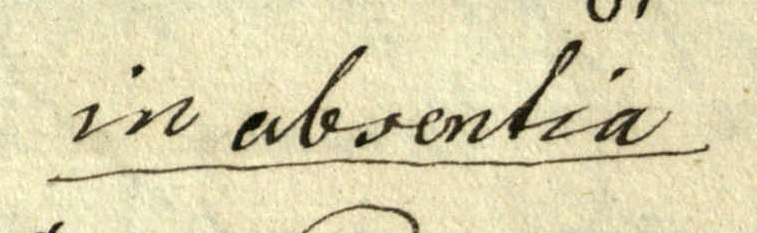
in absentia
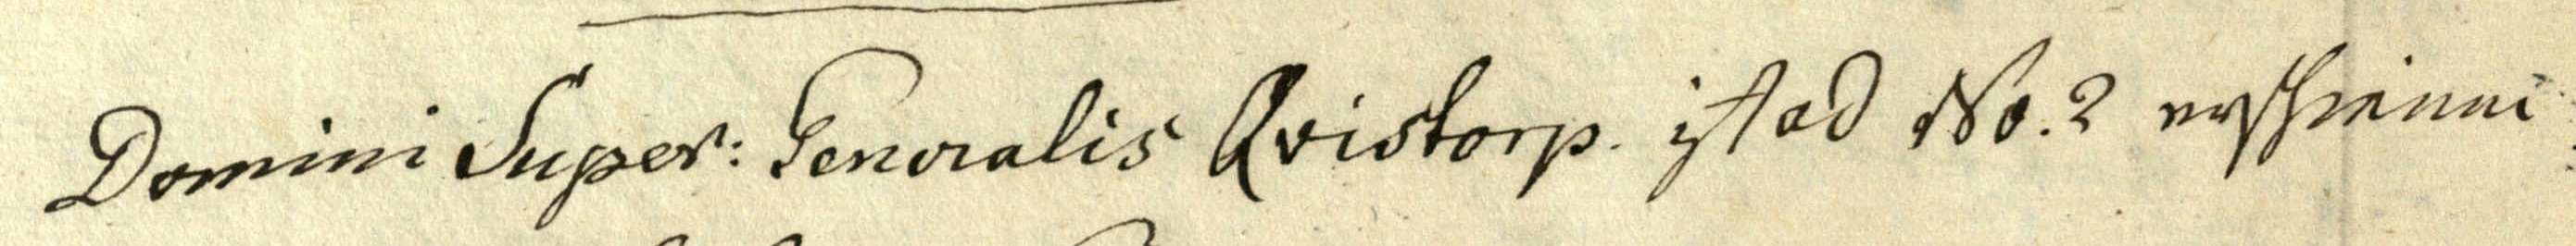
Domini Super Generalis Quistorp ist ad No. 2 erschienen
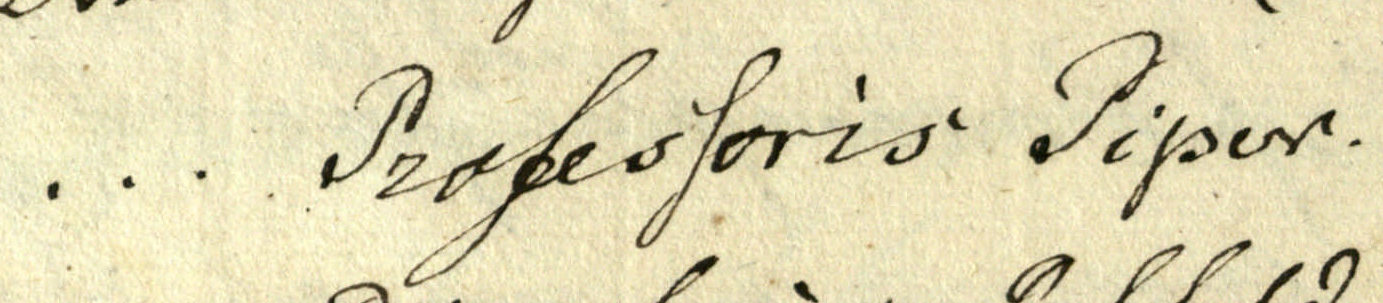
Professoris Piper.
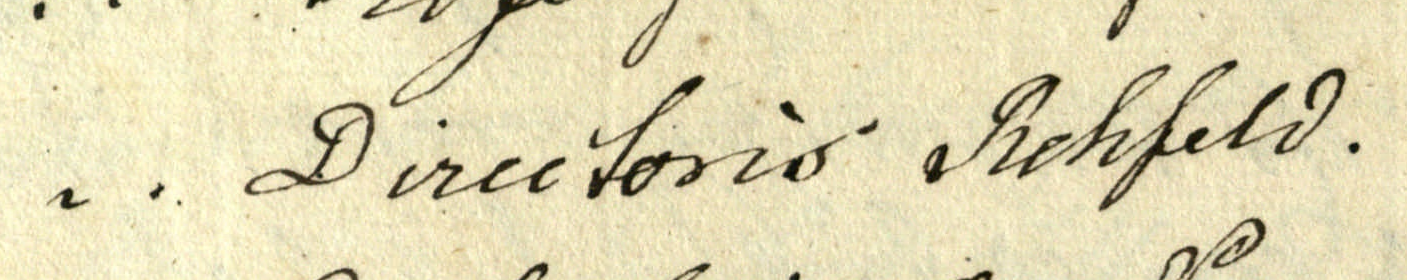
Directoris Rehfeld.
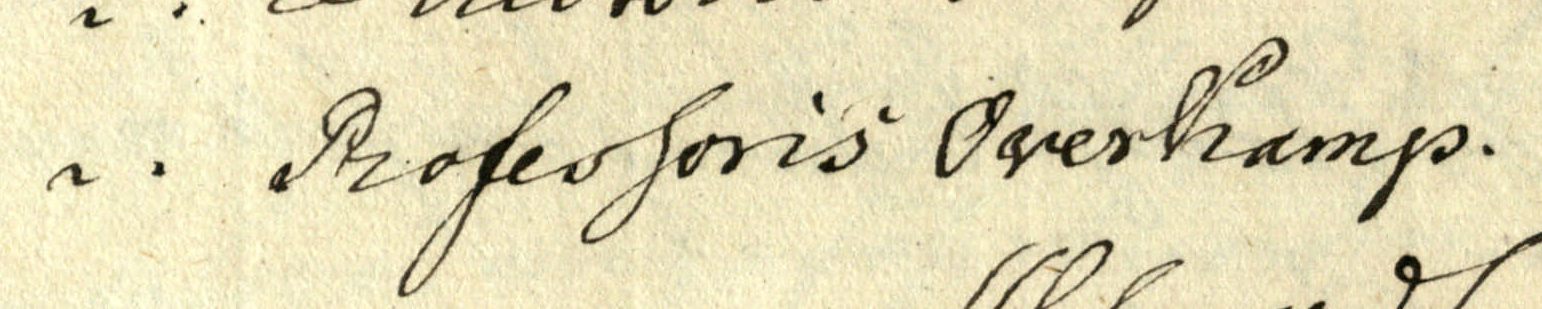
Professoris Overkamp.
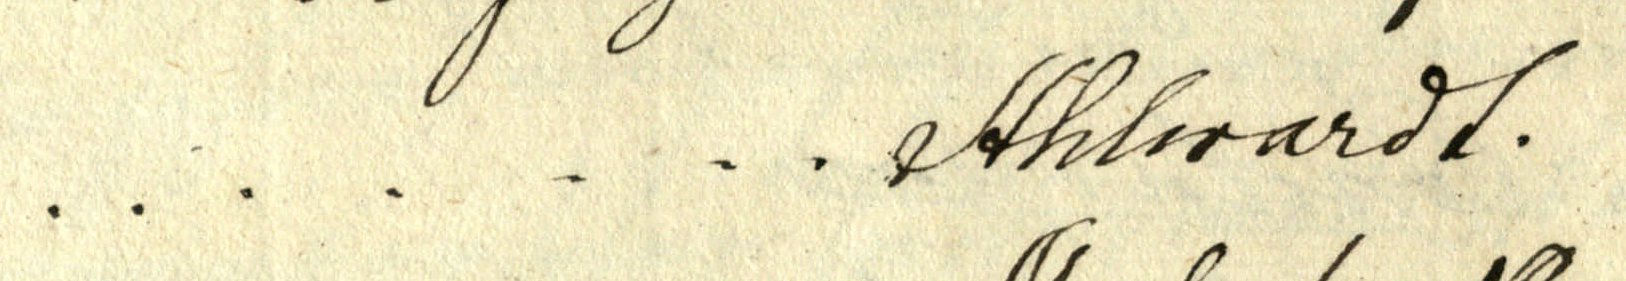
Ahlwardt.
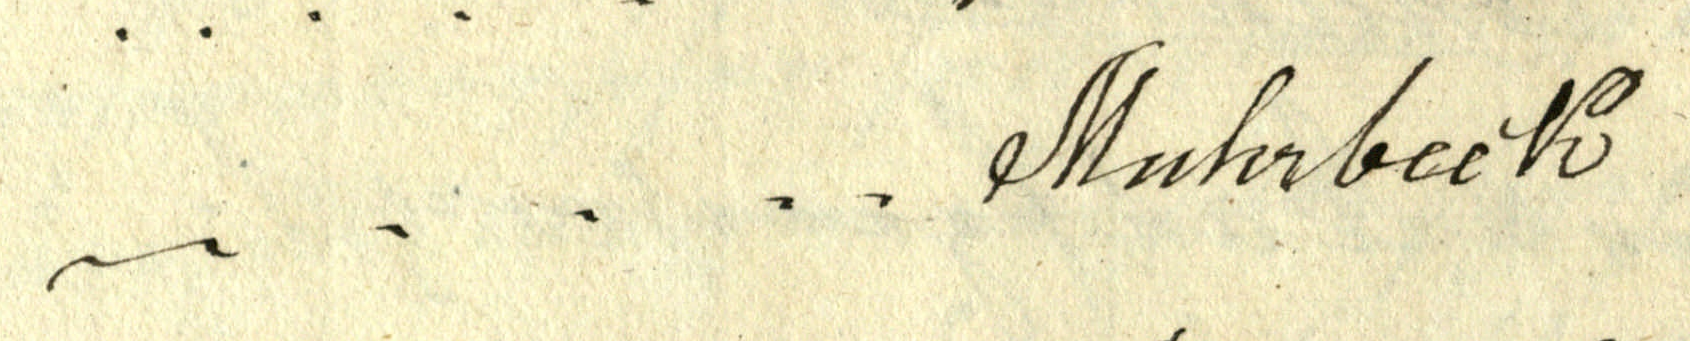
Muhrbeck
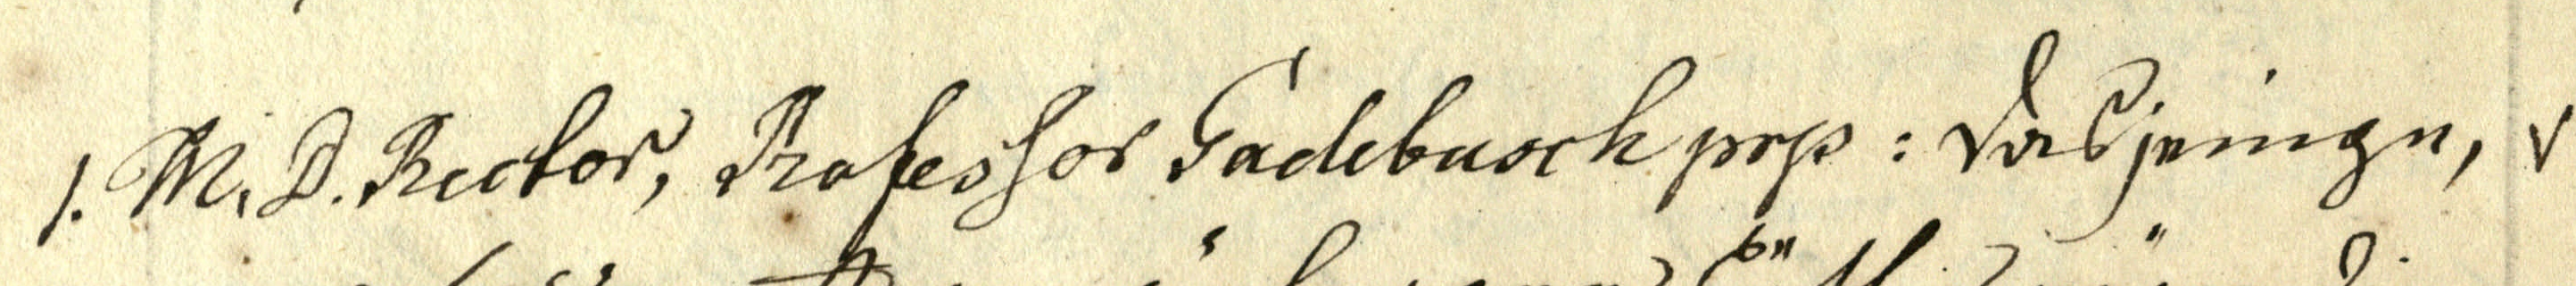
1. M. D. Rector, Professor Gadebusch prp. Dasjenige,
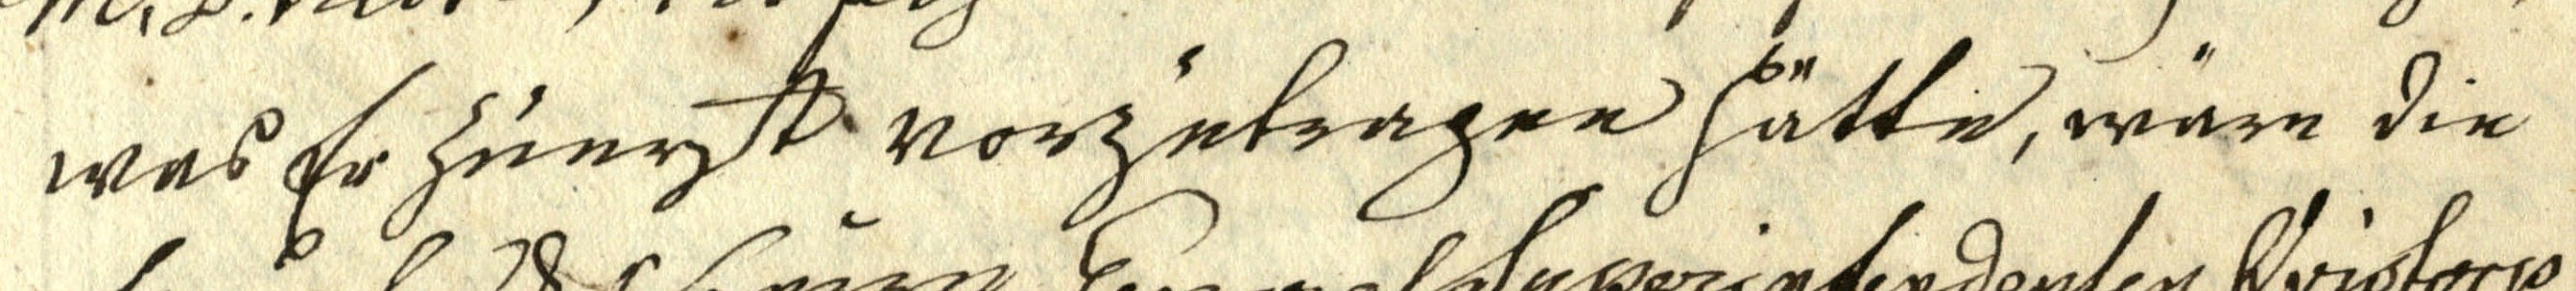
was Er zuerst vorzutragen hätte, wäre die
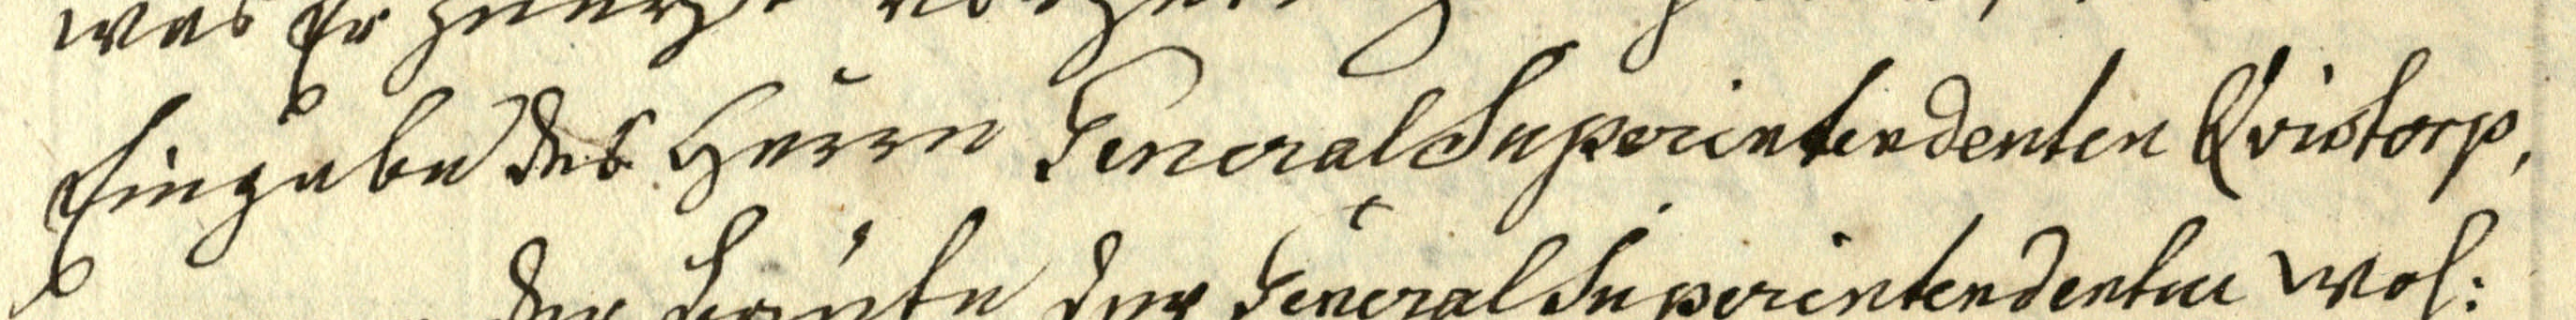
Eingabe des Herrn GeneralSuperintendenten Quistorp,
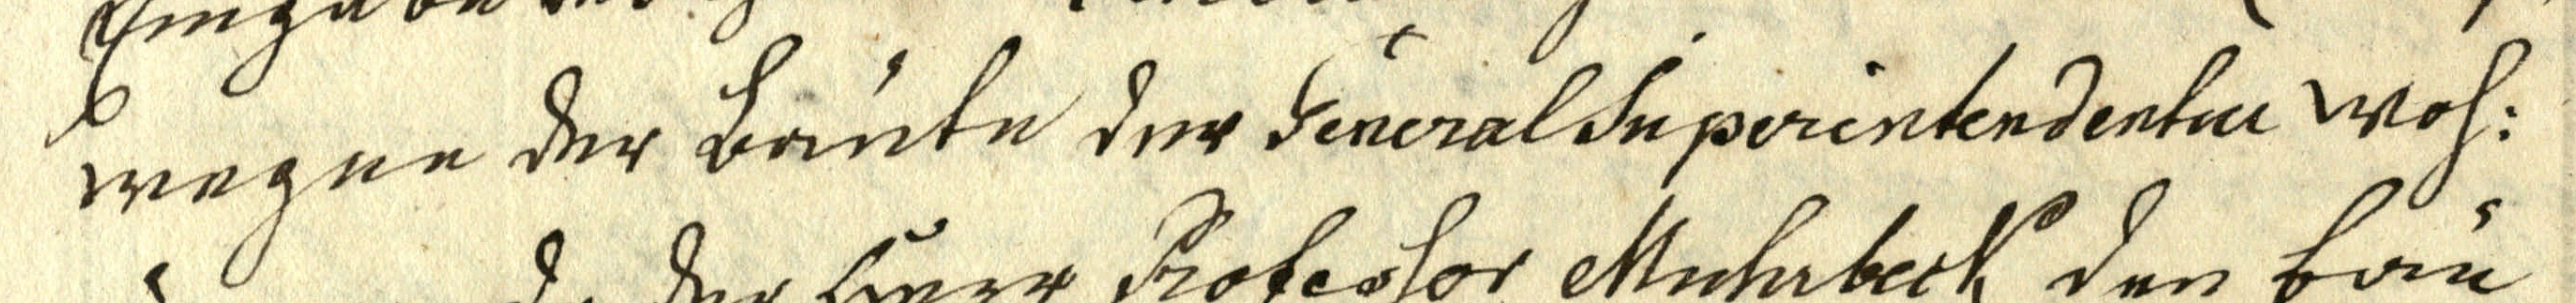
wegen der Baute der GeneralSuperintendenten Woh¬
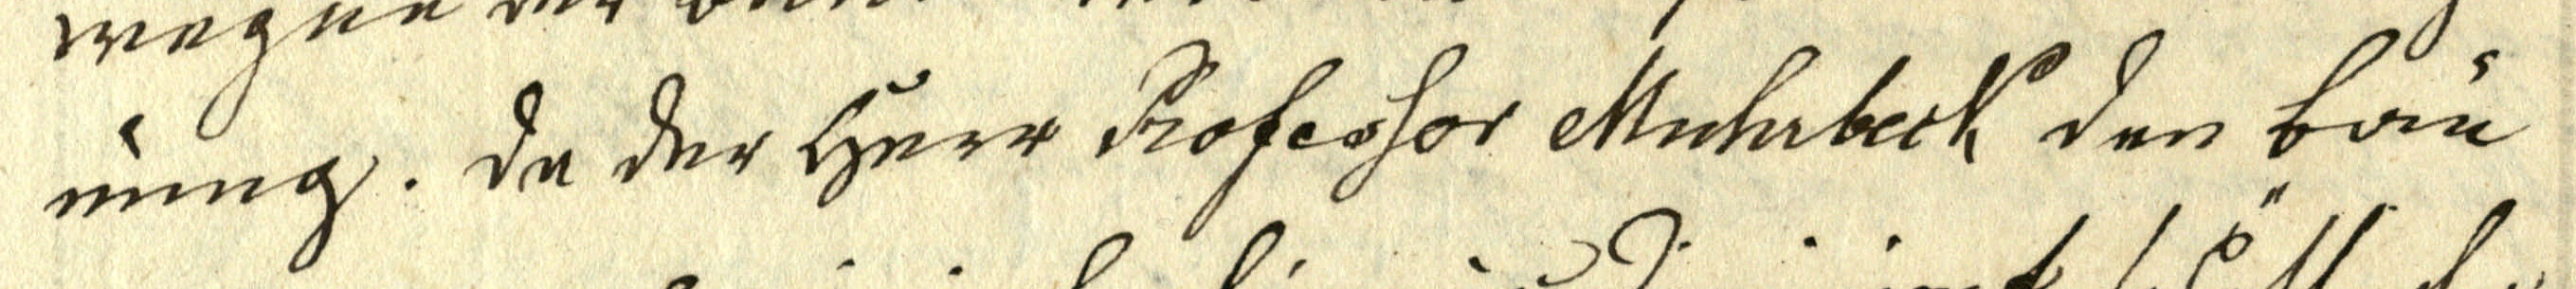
nung. Da der Herr Professor Muhrbeck den Bau
